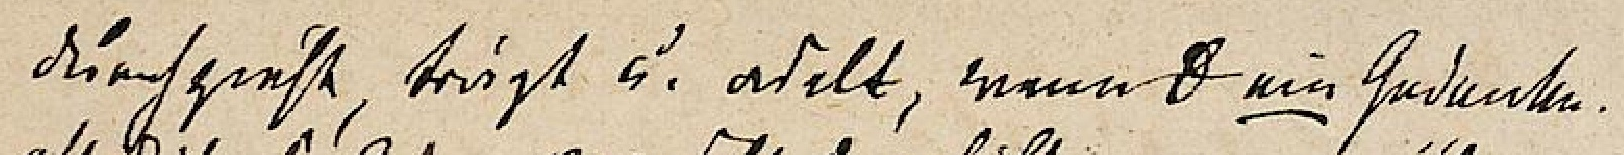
durchzieht, trägt u. adelt, wenn o ein Gedanke
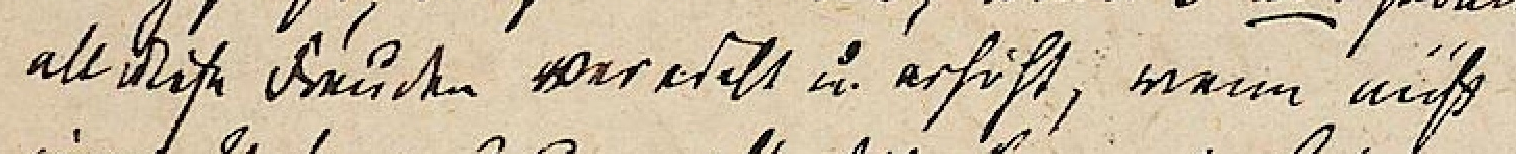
all diese Freuden veredelt u. erhöht, wenn nicht
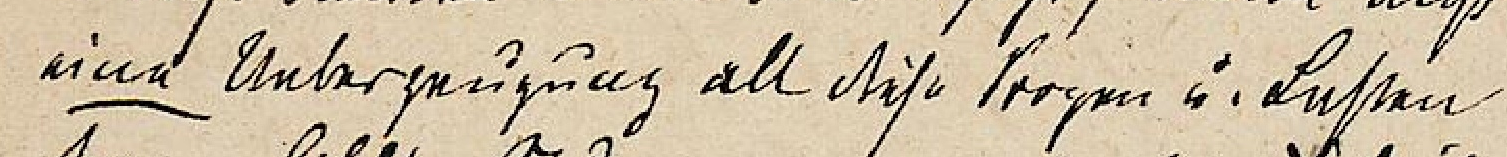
eine Ueberzeugung all dies Sorgen u. Lasten
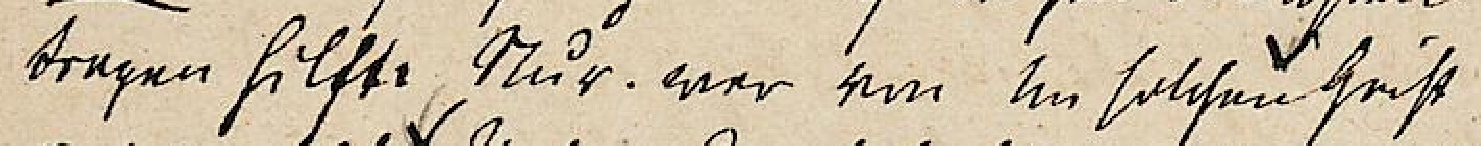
tragen hilft: Nur. wer von 1m solchen Geist
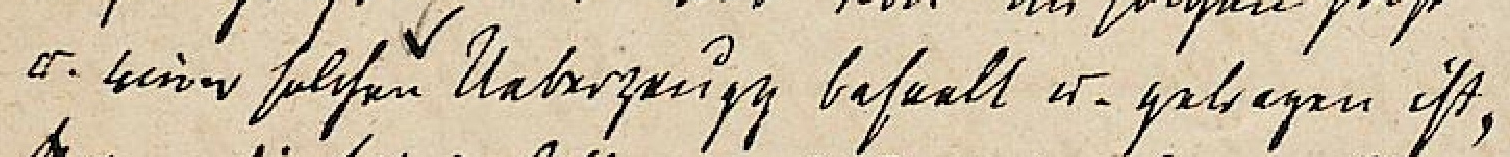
u. einer solchen Ueberzeugg. besslt u. getragen ist,
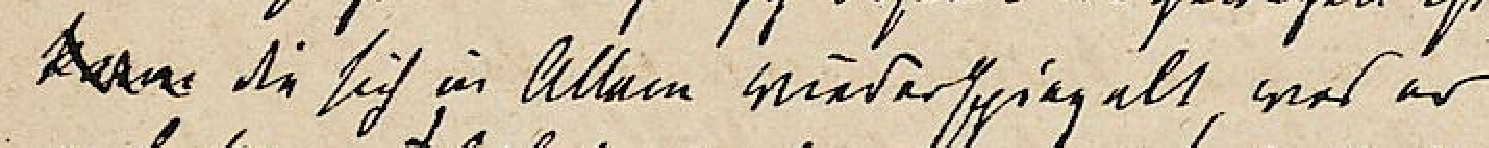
kann die sich in Allem wiederspiegelt, was er
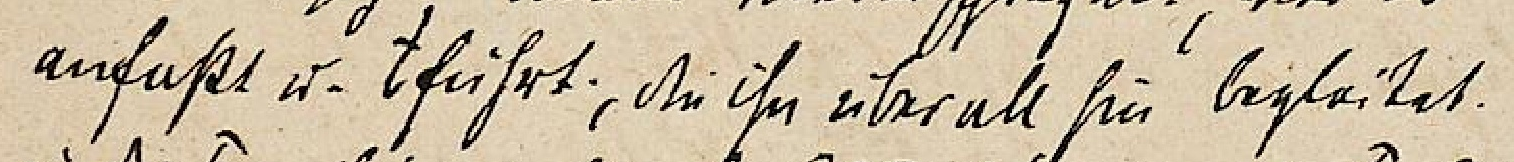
anfaßt u. sführt; die ihn überall hin begleitet.
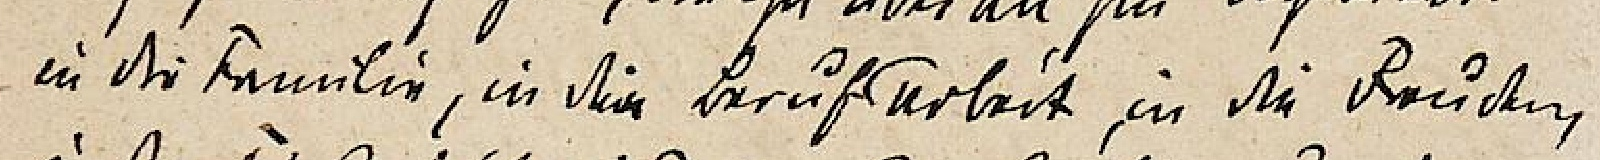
in die Familie, in die Berufsarbeit, in die Rouden,
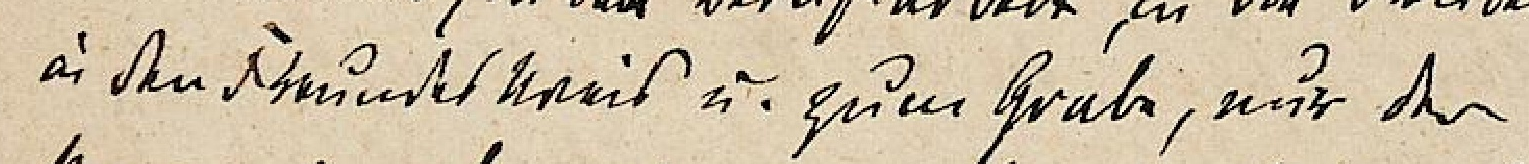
in den Freundeskreis u. zum Grabe, nur der
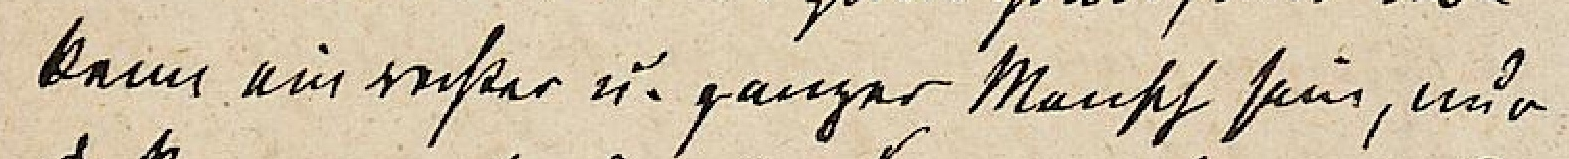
kann ein rechter u. ganzer Mensch sein, nur
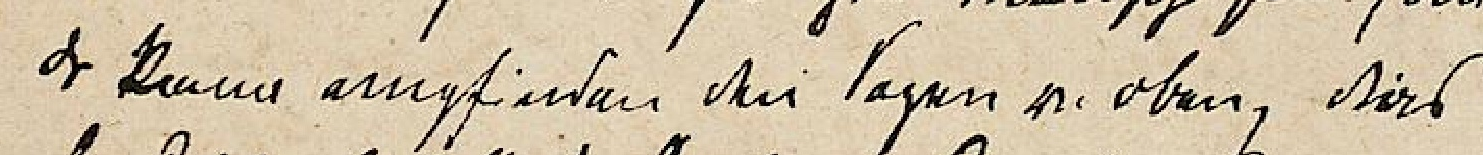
dr kann empfinden den Segen v. oben, das
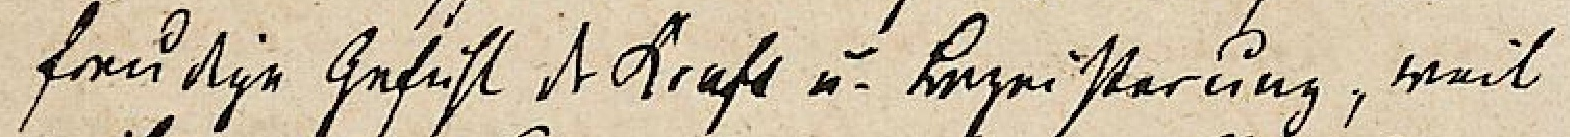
freudige Gefühl dr Kraft u. Begeisterung, weil
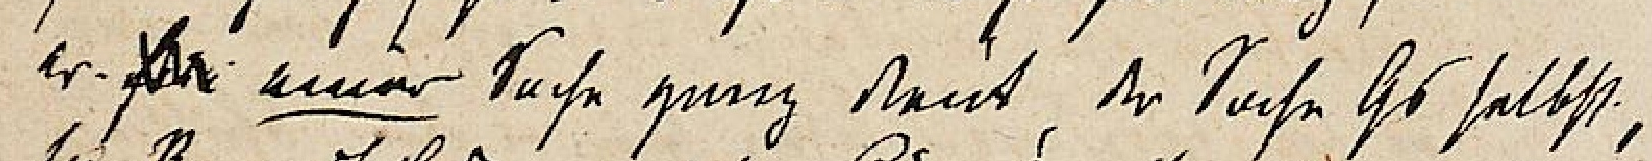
er frei einer Sache ganz dient, der Sache Gs selbst,
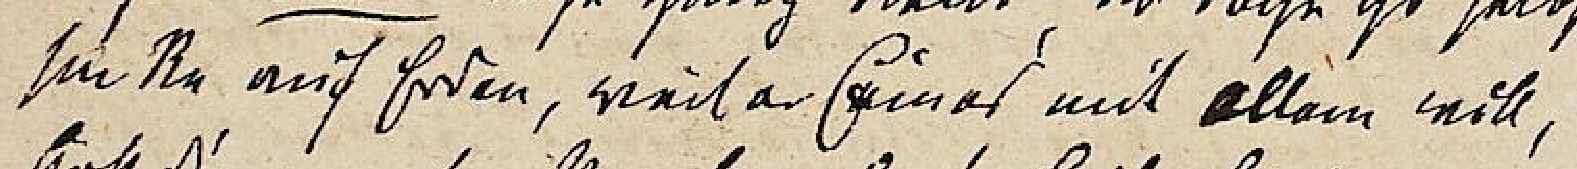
sm Re auf Erden, weil er Eines mit allem will,
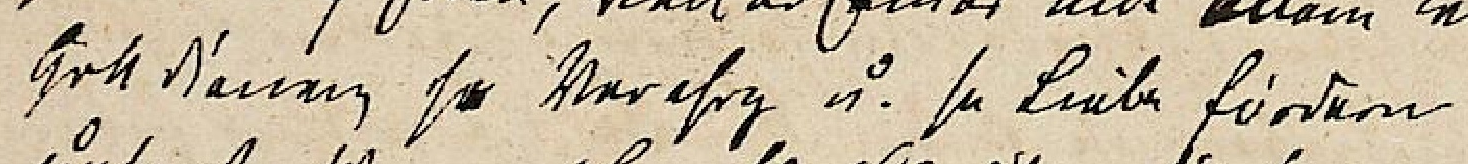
Gott dienen, sr Verehrg. u. sn. Liebe fördern
